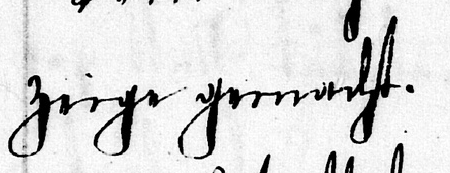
zeige gemacht.
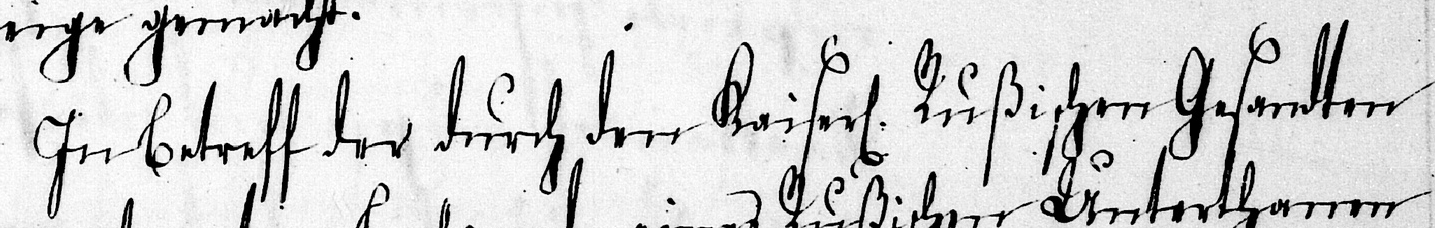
In Betreff der durch den Kaiserl. Rußischen Gesandten
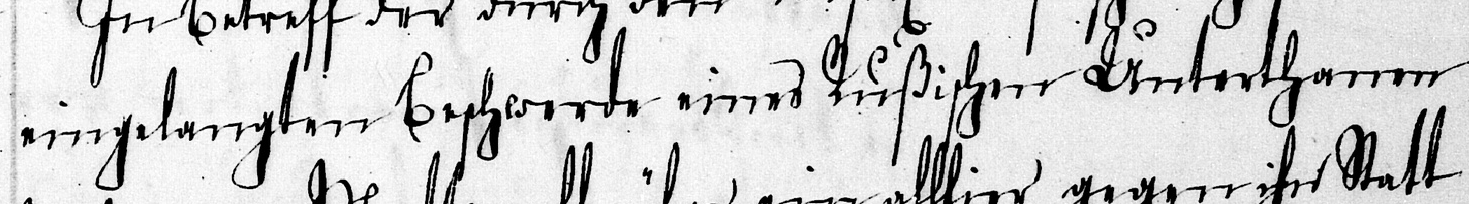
eingelegten Beschwerde eines Rußischen Unterthanen
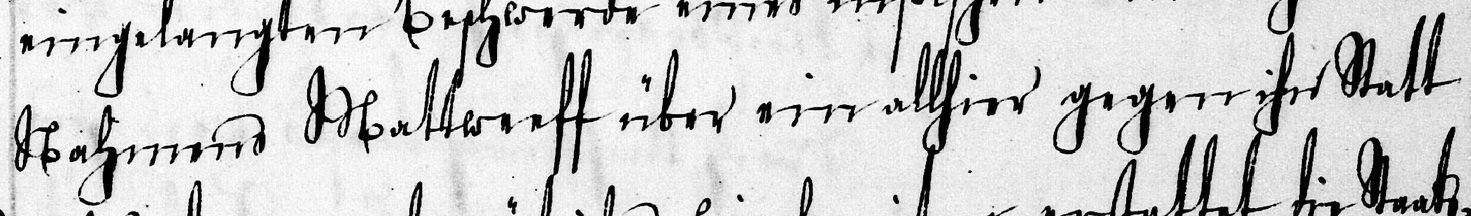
Nahmens Mattweeff über ein allhier gegen ihn Statt
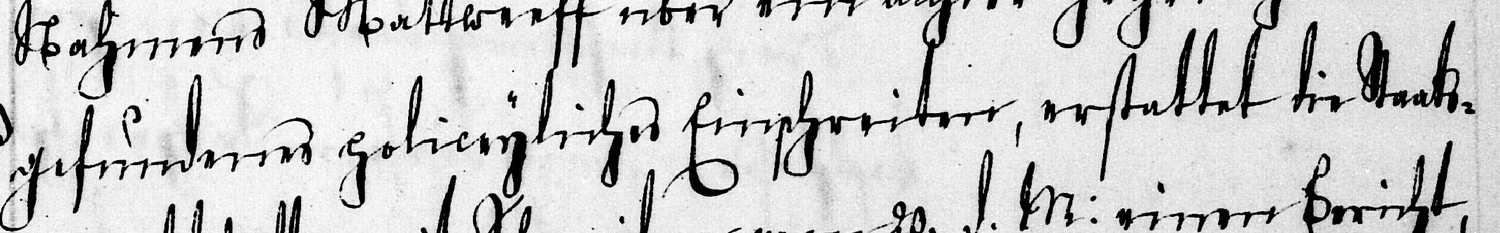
gefundenes policeyliches Einschreiten, erstattet die St¬
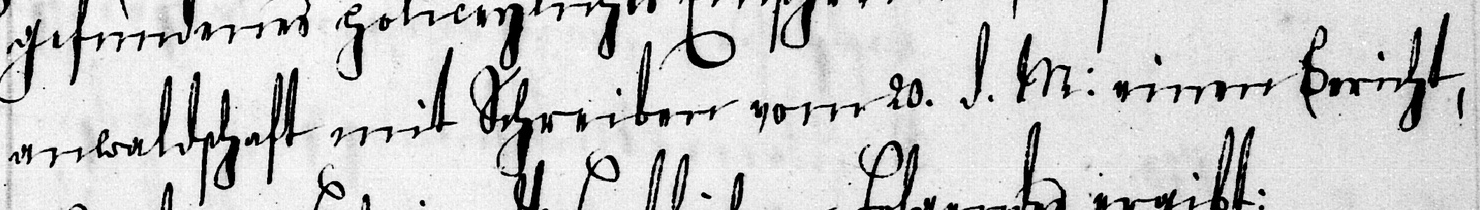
anwaldschaft mit Schreiben vom 20. d. M: einen Bericht,
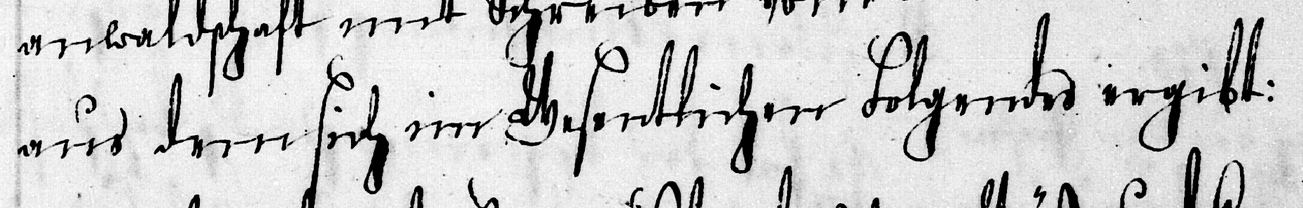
aus dem sich im Wesentlichen Folgendes ergibt:
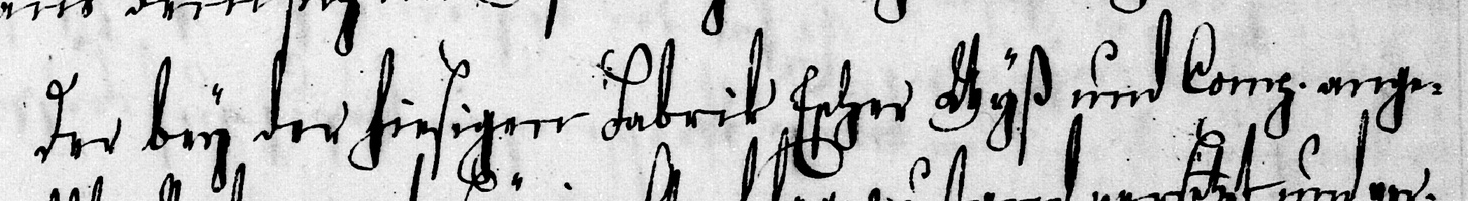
Der bey der hiesigen Fabrik Escher Wyß und Comp. ang¬
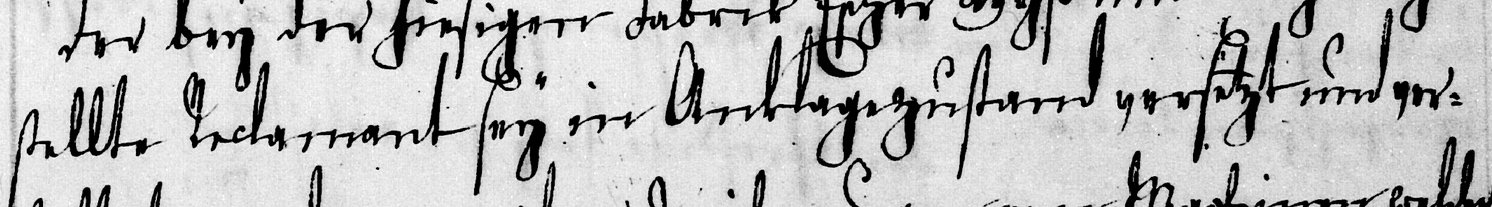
stellte Reclamant sey in Anklagezustand versetzt und ver¬
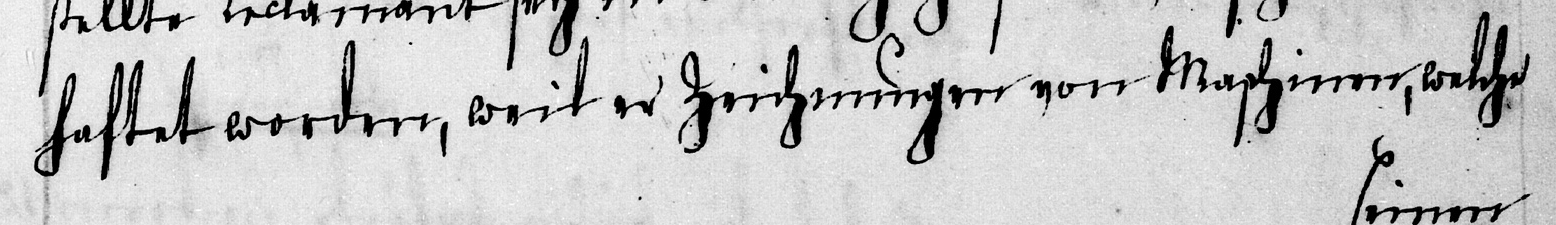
haftet worden, weil er Zeichnungen von Maschinen, welche
